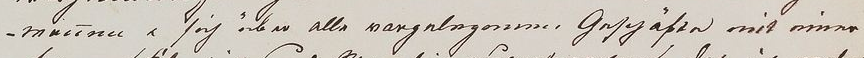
wonnen & sich über alle vorgelegenen Geschäfte mit einer
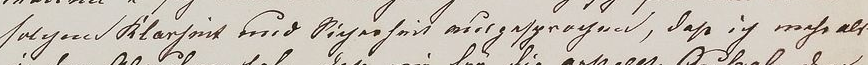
solchen Klarheit und Sicherheit ausgesprochen, daß ich mehr als
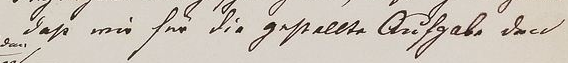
daß wir für die gestellte Aufgabe den
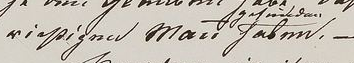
richtigen Mann gefunden haben. –
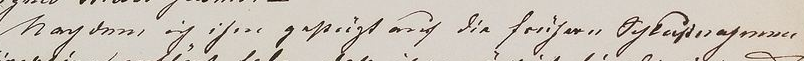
Nachdem ich ihm gestüzt auf die frühern Schlußnahmen
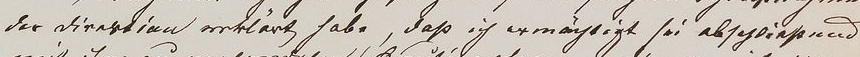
der Direktion erklärt habe, daß ich ermächtigt sei abschließend
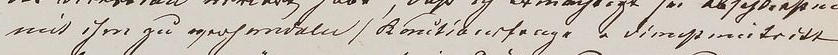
mit ihm zu verhandeln (Kautionsfrage & Dienstantritt
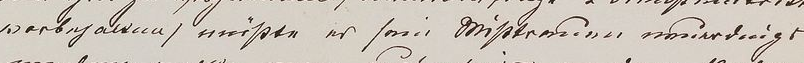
vorbehalten) müßte es sein Mißtrauen neuerdings
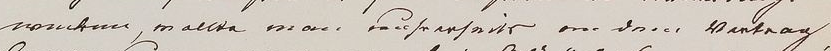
wecken, wollte man unsrerseits an dem Vertrag
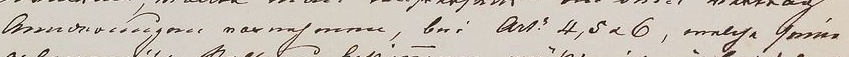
Aenderungen vornehmen, bei Artl 4, 5 & 6, welche seine
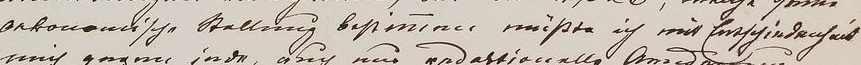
oekonomische Stellung bestimmen müßte ich mit Entschiedenheit
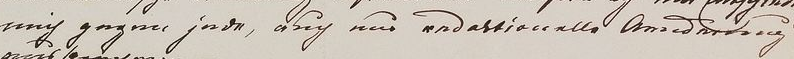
mich gegen jede, auch nur redaktionelle Aenderung
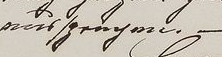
aussprechen. –
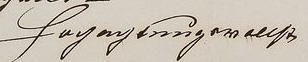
Hochachtungsvollst
